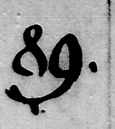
92.
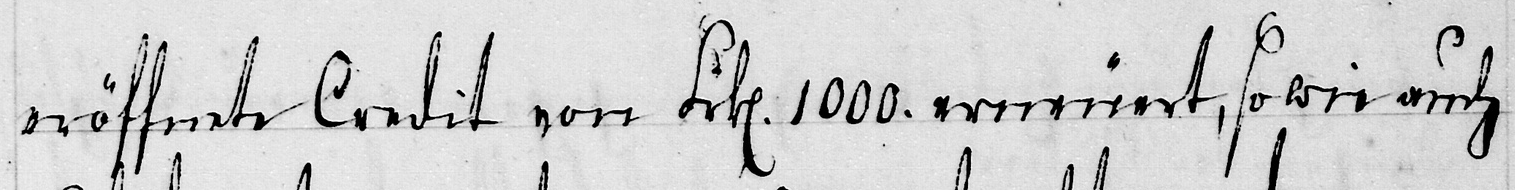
eröffnete Credit von Frk[en]. 1000. erneuert, sowie auch
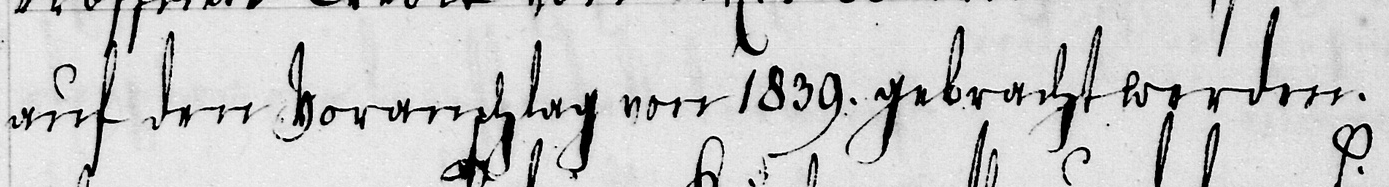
auf den Voranschlag von 1839. gebracht werden.
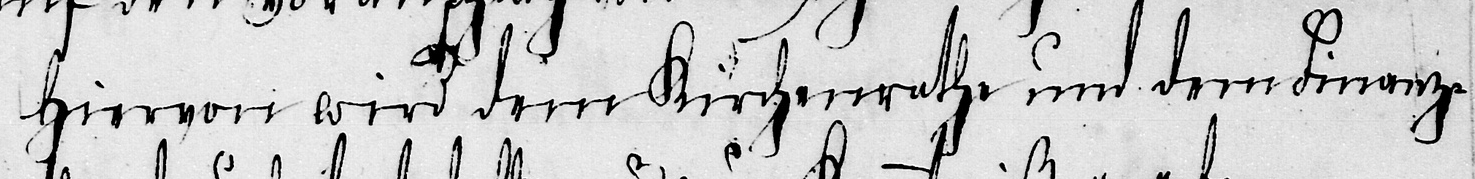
Hiervon wird dem Kirchenrathe und dem Finanz¬
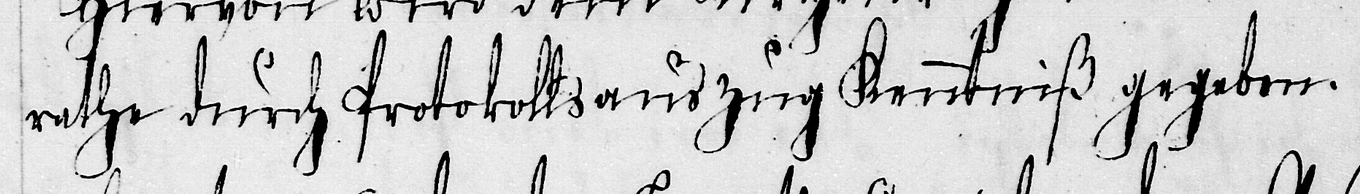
rathe durch Protokollsauszug Kenntniß gegeben.
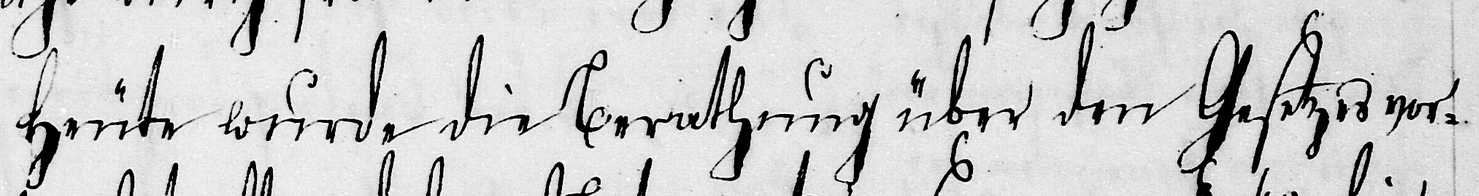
Heute wurde die Berathung über den Gesetzesvor¬
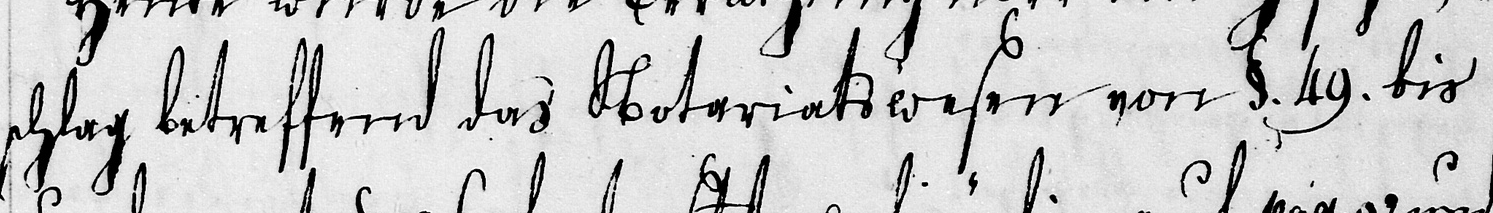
schlag betreffend das Notariatswesen von §. 49. bis
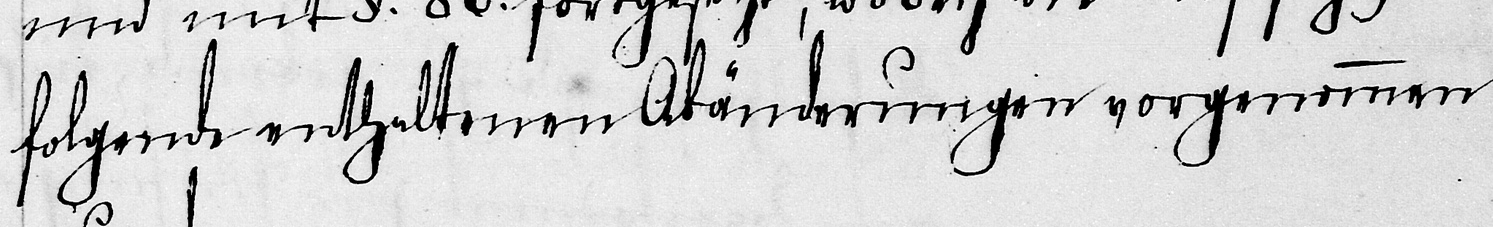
folgende enthaltenen Abänderungen vorgenommen
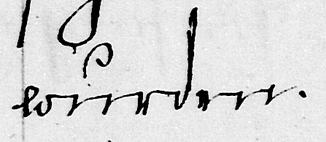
wurden.
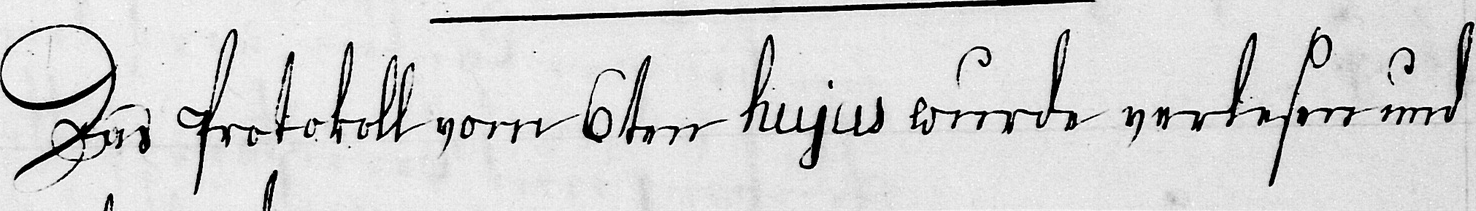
Das Protokoll vom 6ten hujus wurde verlesen und
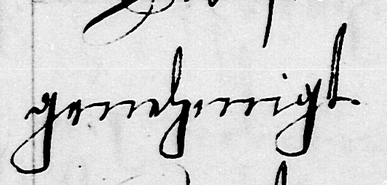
genehmigt.
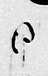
und
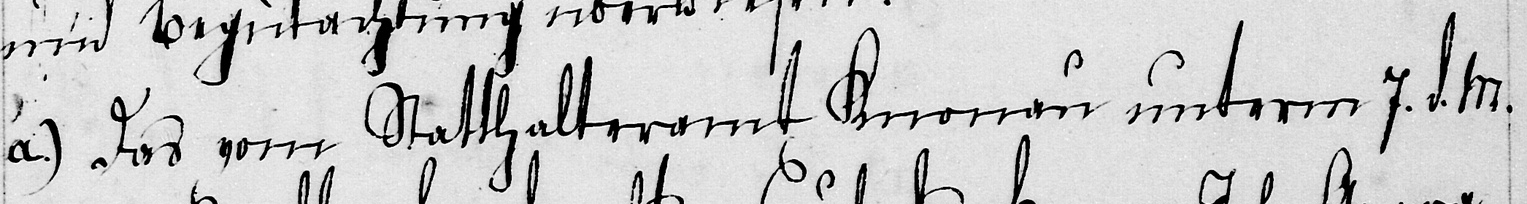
a.) Das vom Statthalteramt Knonau unterm 7. d. M.
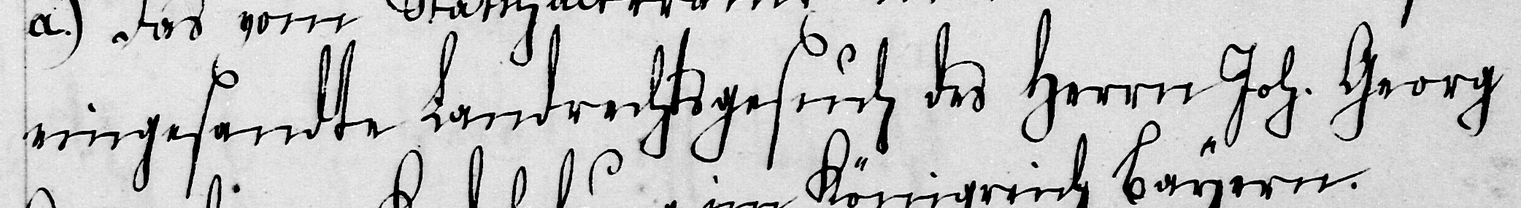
eingesandte Landrechtsgesuch des Herrn Joh. Georg
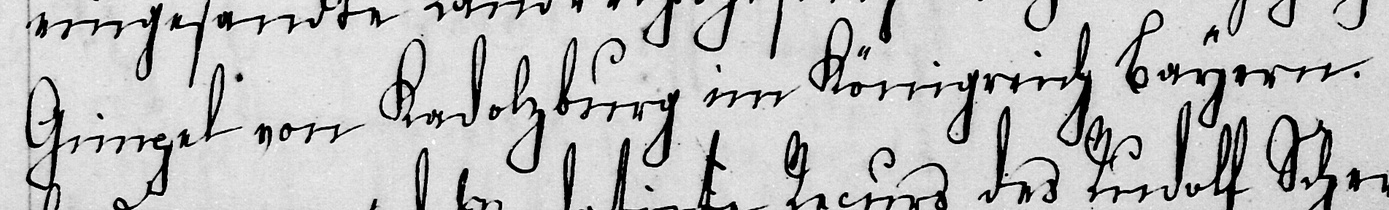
Gimpel von Kadolzburg im Königreich Bayern.
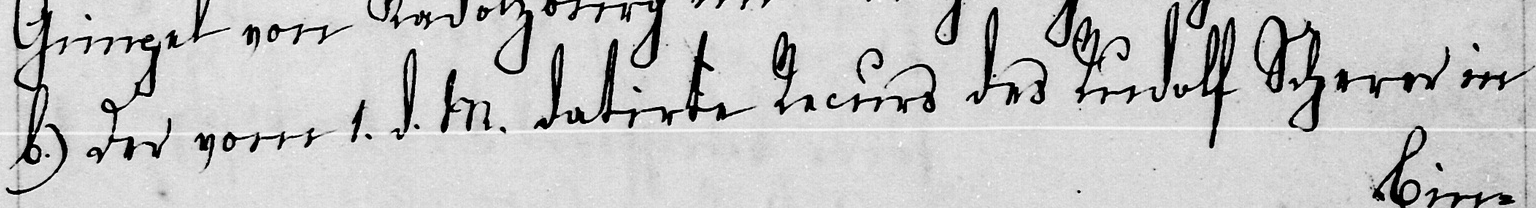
b.) Der vom 1. d. M. datirte Recurs des Rudolf Scherer in
